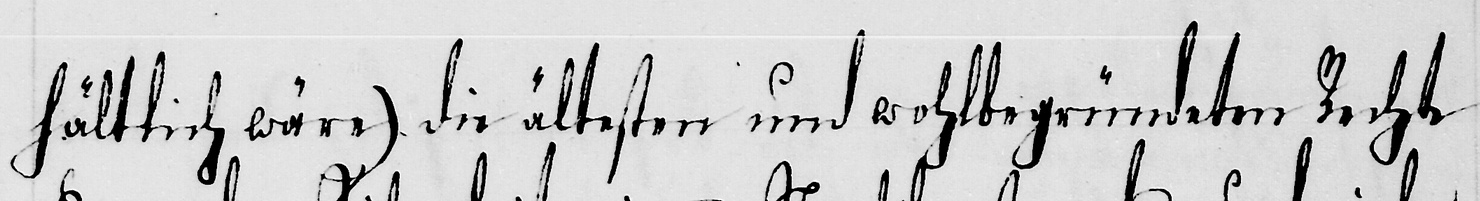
hältlich wäre) die ältesten und wohlbegründeten Rechte
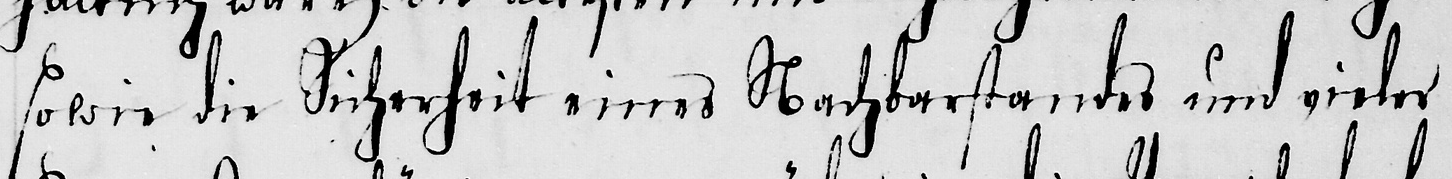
sowie die Sicherheit eines Nachbarstandes und vieler
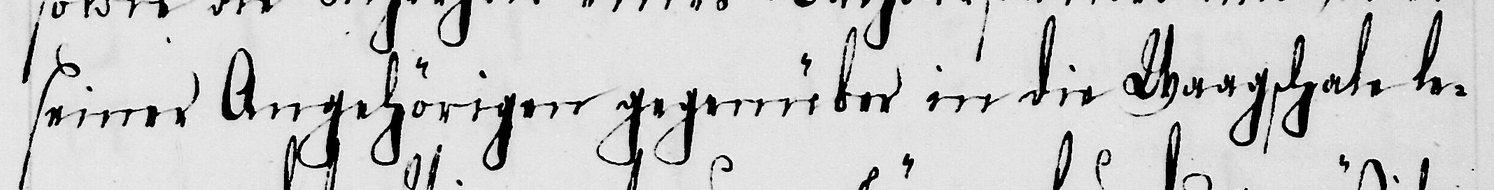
seiner Angehörigen gegenüber in die Waagschale le¬
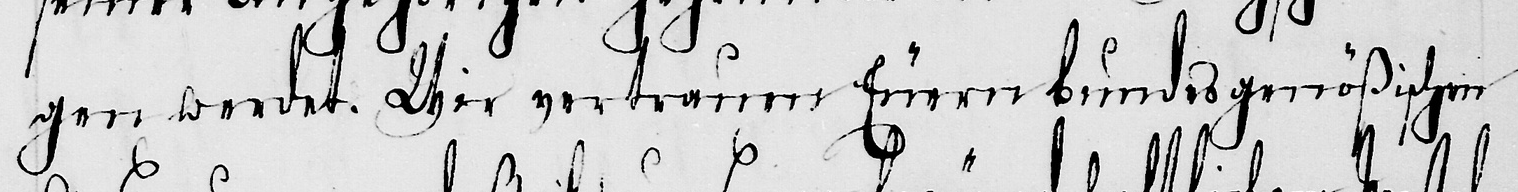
gen werdet. Wir vertrauen Euern bundesgenößischen
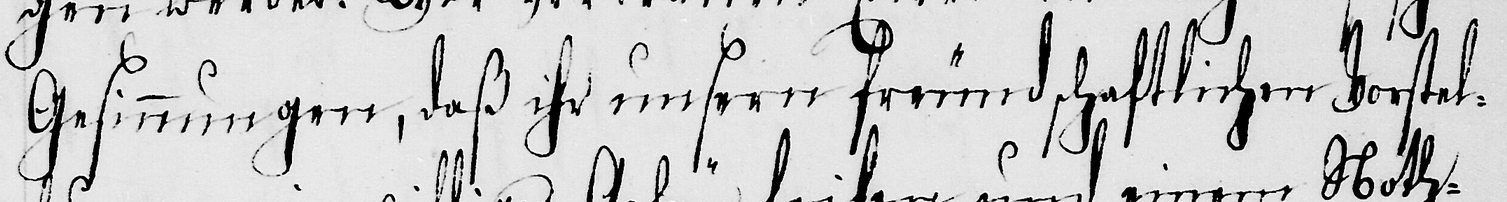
Gesinnungen, daß ihr unsern freundschaftlichen Vorstel¬
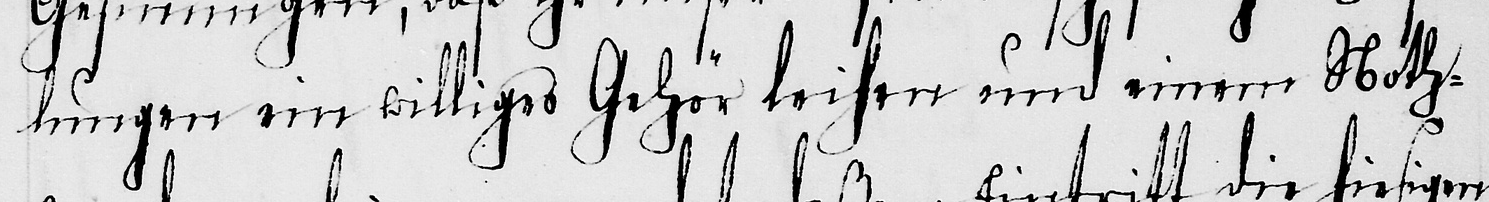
lungen ein williges Gehör leihen und einem Noth¬
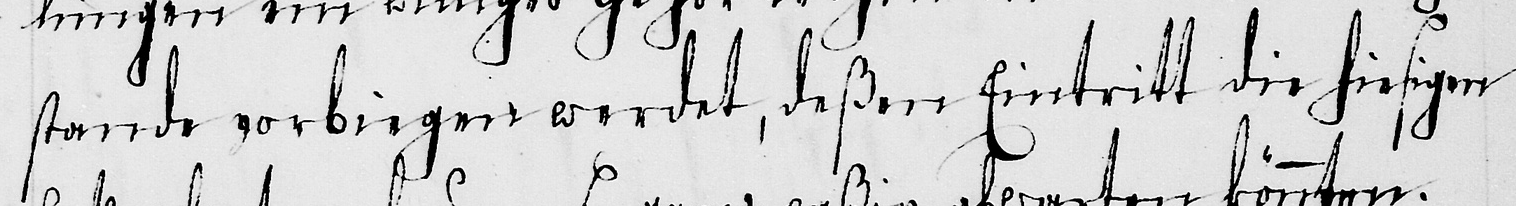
stande vorbiegen werdet, deßen Eintritt die hiesigen
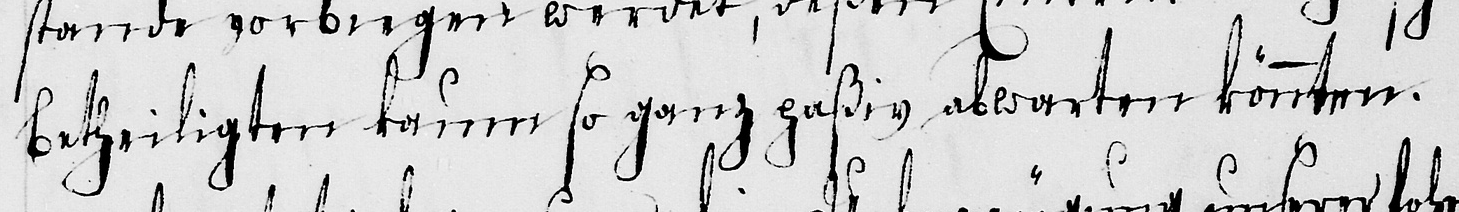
Betheiligten kaum so ganz paßiv abwarten könnten.
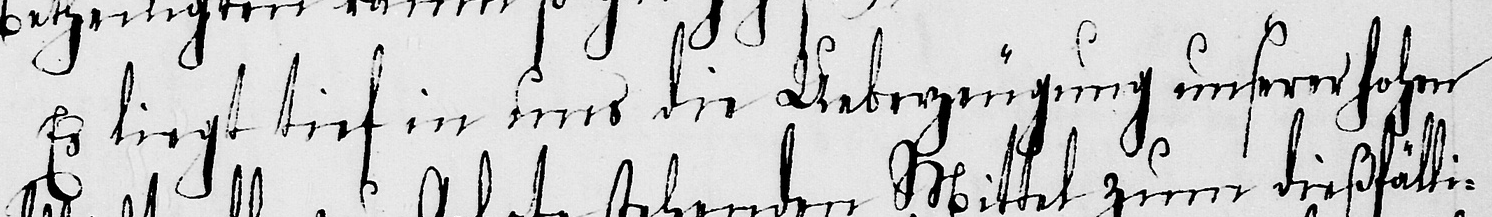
Es liegt tief in uns die Ueberzeugung unserer hohen
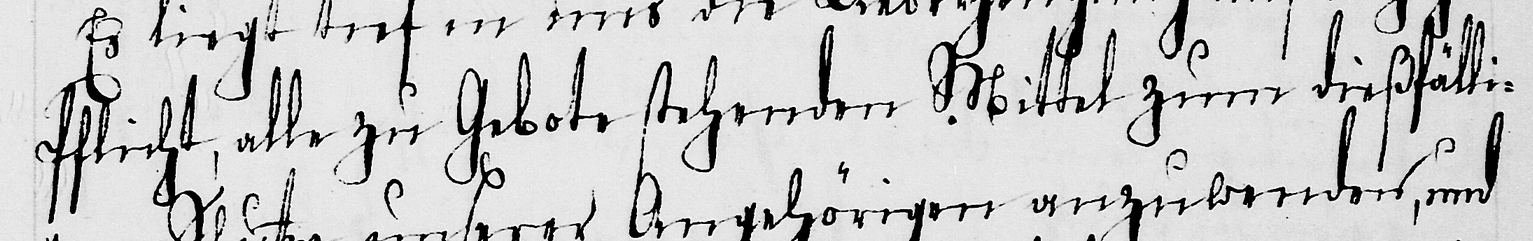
Pflicht, alle zu Gebote stehenden Mittel zum dießfälli¬
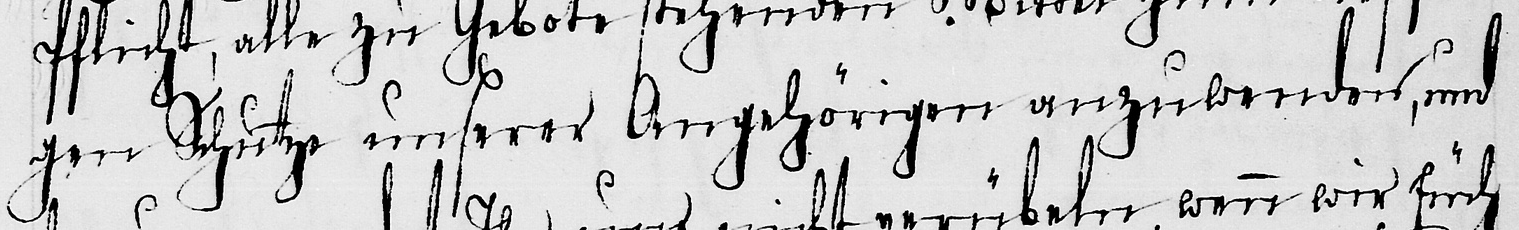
gen Schutze unserer Angehörigen anzuwenden, und
